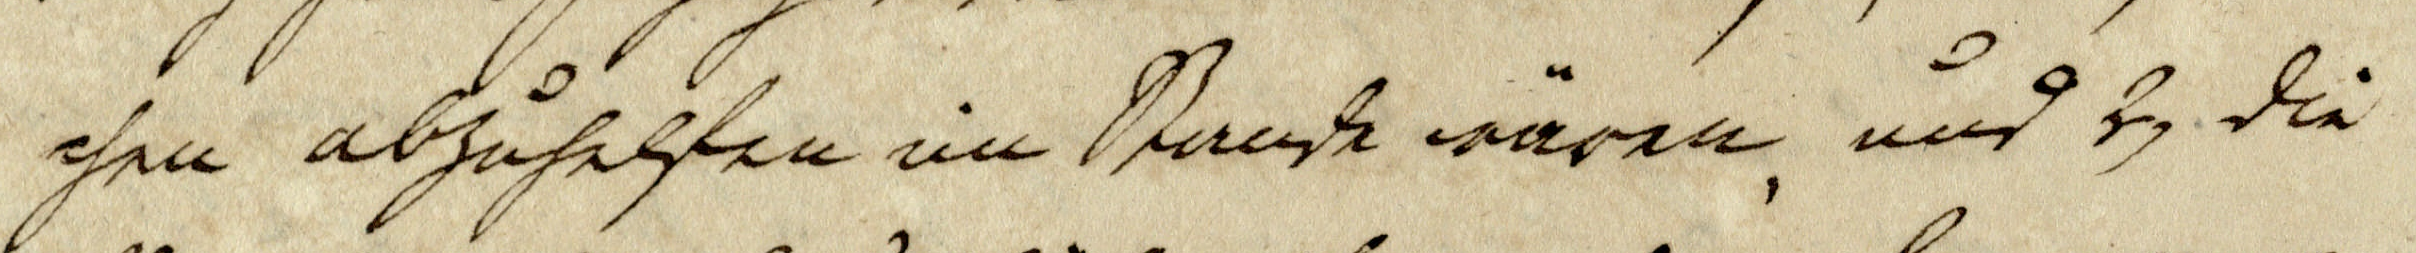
chen abzuhelfen im Stande wären, und 2., die
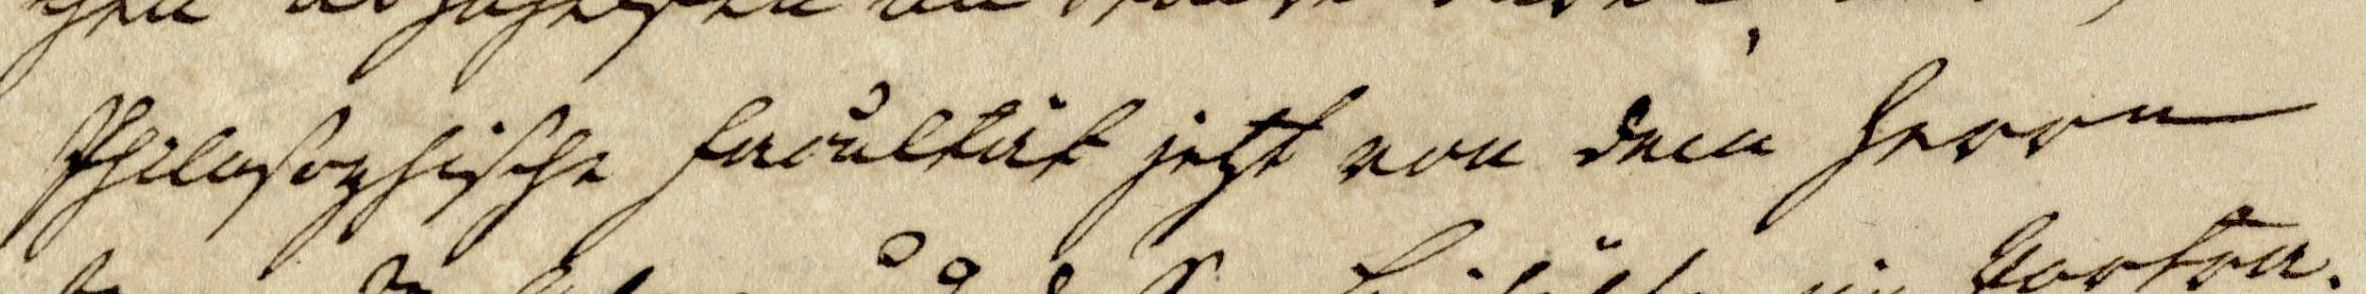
Philosophische Facultät jetzt von dem Herrn
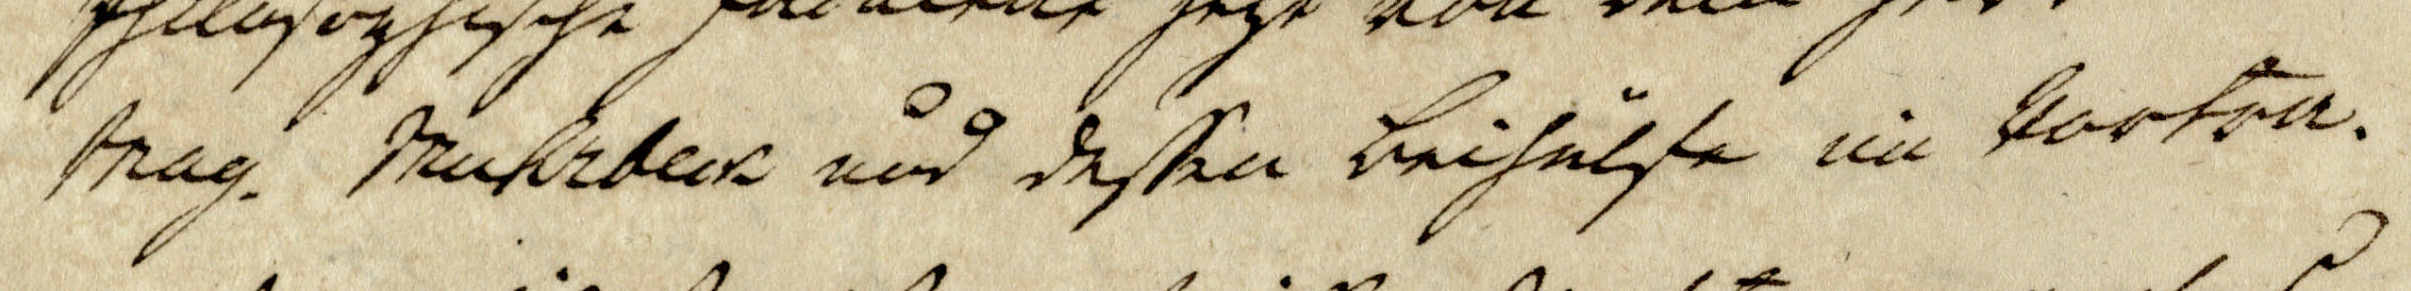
Mag. Muhrbeck und dessen Beihülfe in Vortra¬
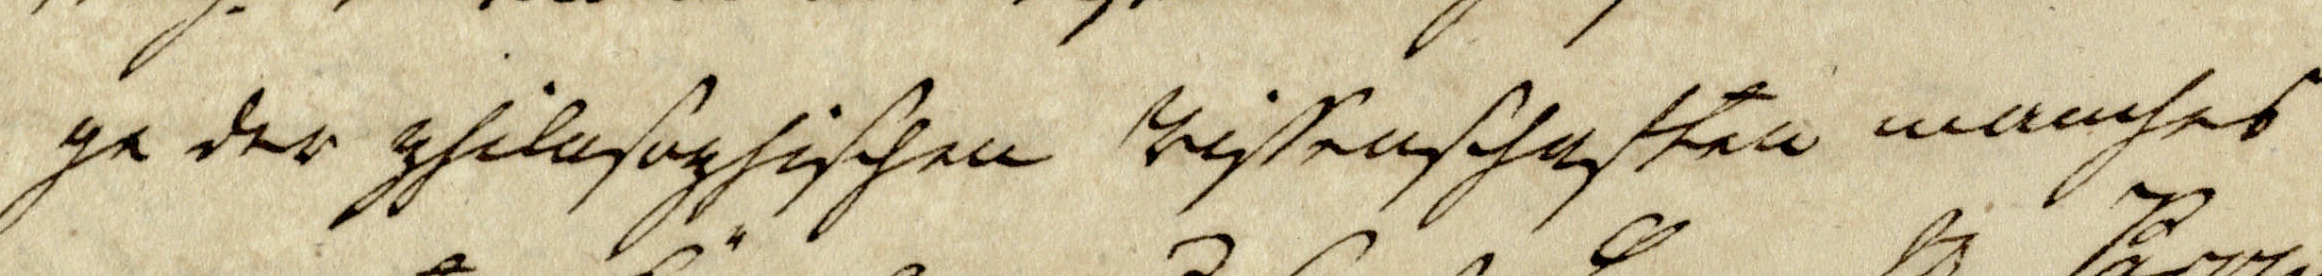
ge der philosophischen Wissenschaften manches
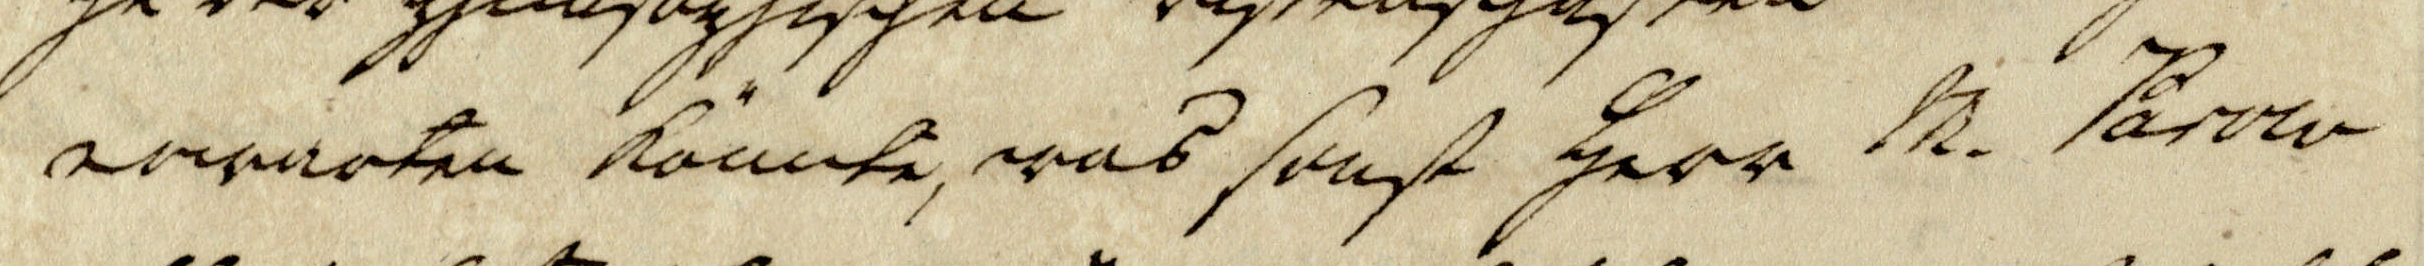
erwarten könnte, was sonst Herr M. Parow
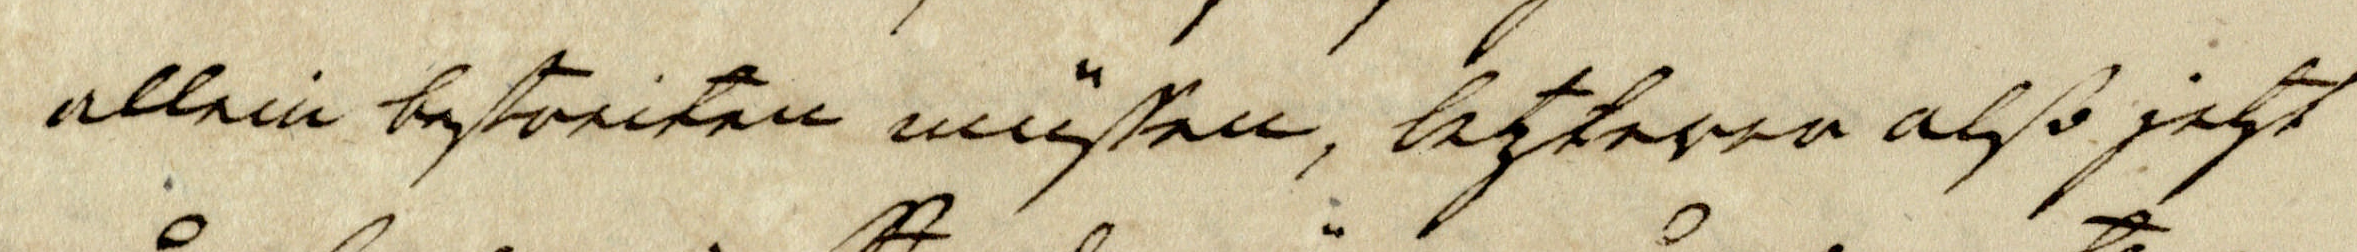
allein bestreiten müssen, letzterer also jetzt
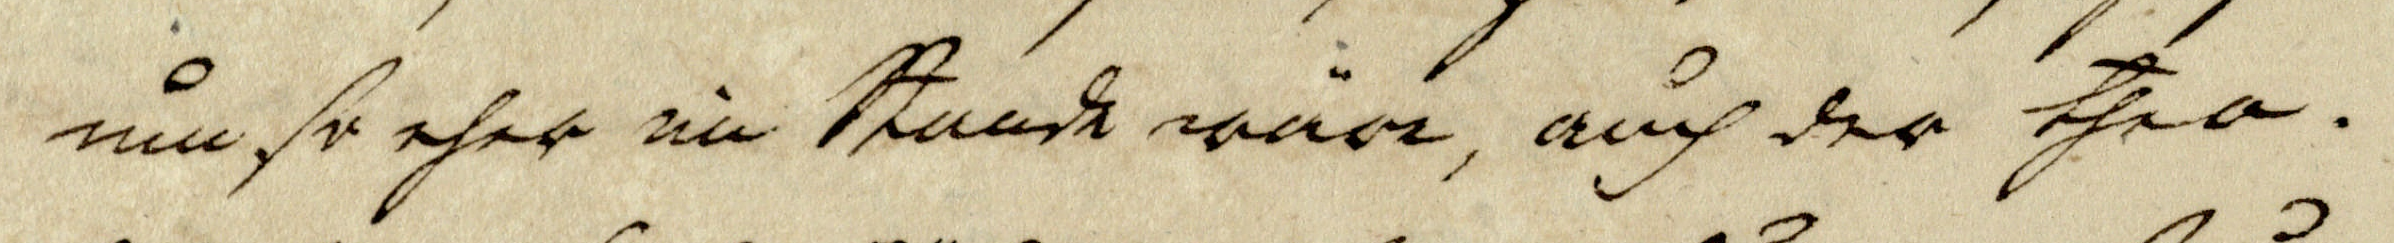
um so eher im Stande wäre, auch der theo¬
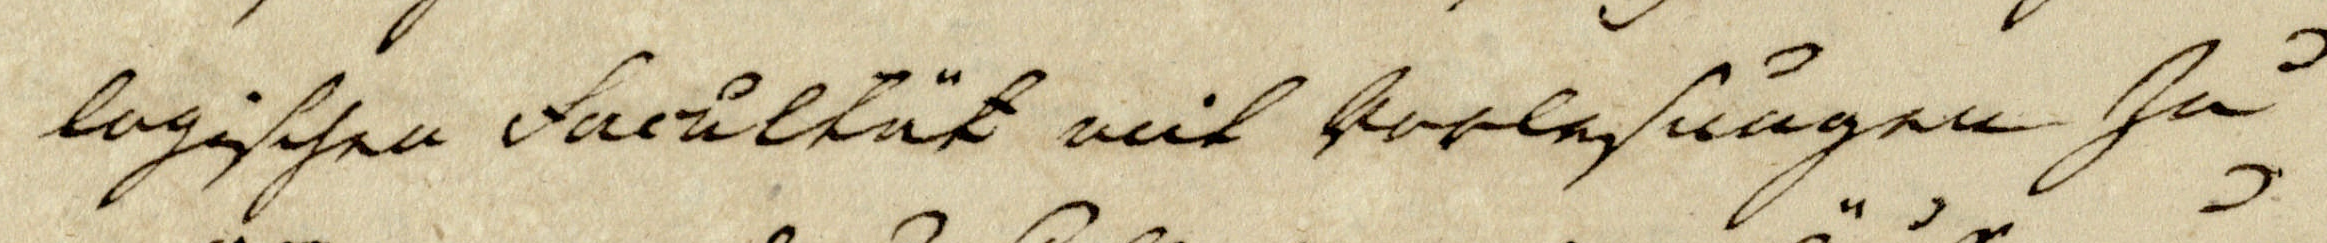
logischen Facultät mit Vorlesungen zu
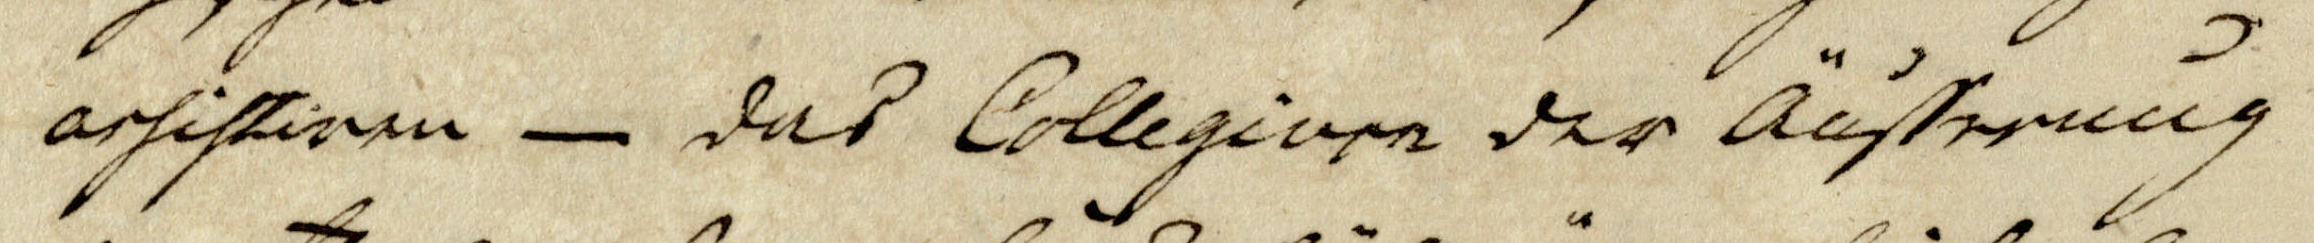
assistiren das Collegium der Äusserung
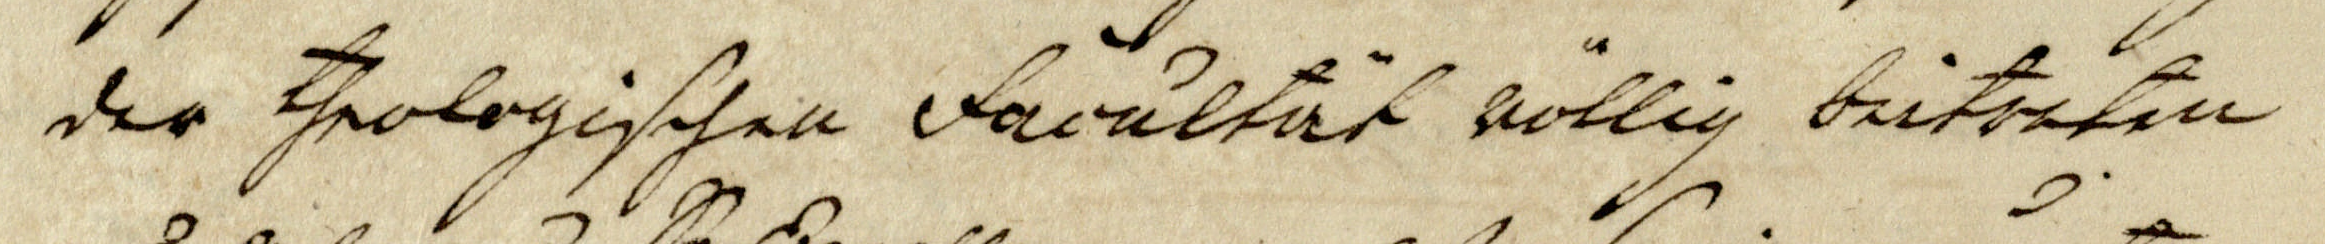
der theologischen Facultät völlig beitreten
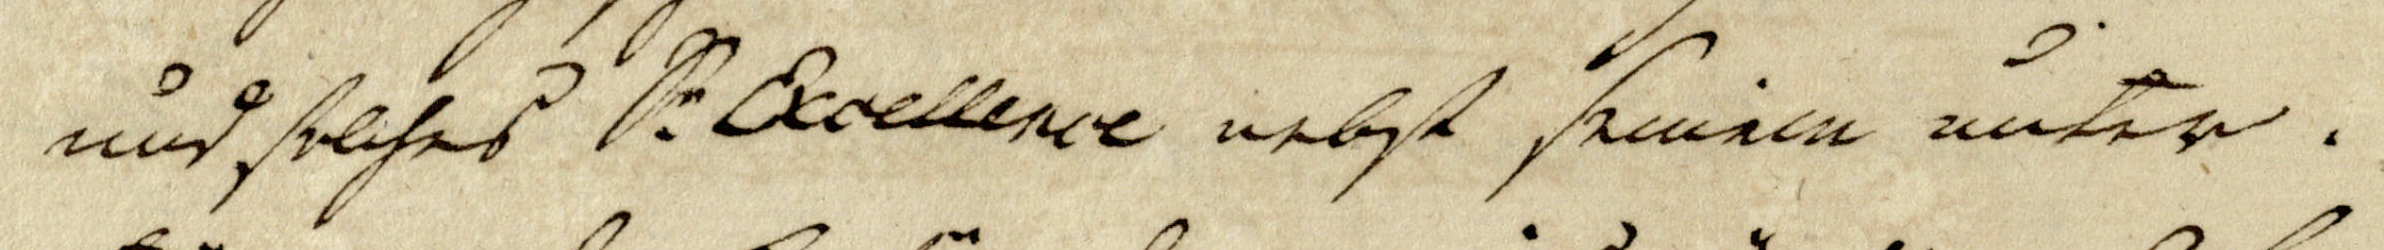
und solches Sr Excellence nebst seinem unter¬
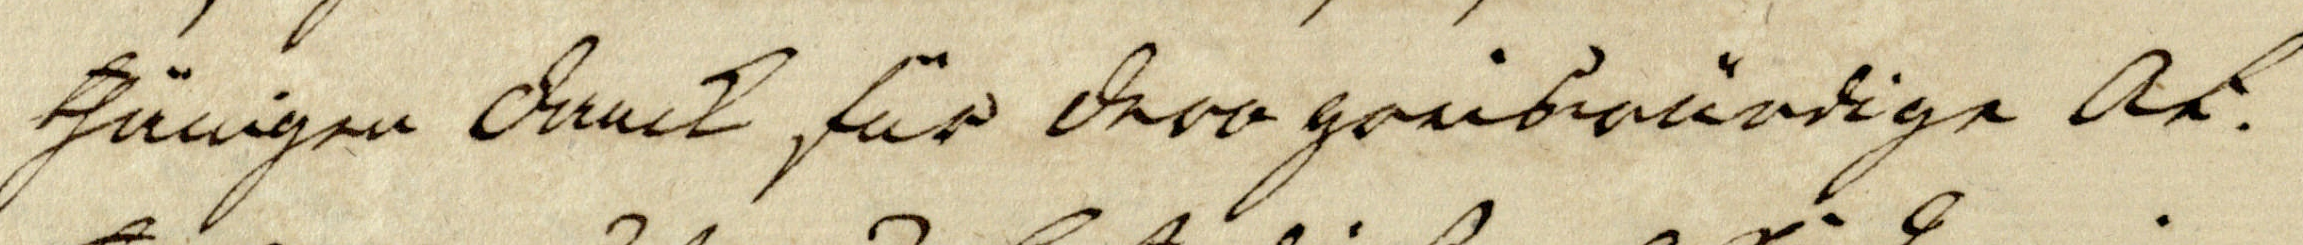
thänigen Danck für dero preiswürdige At¬
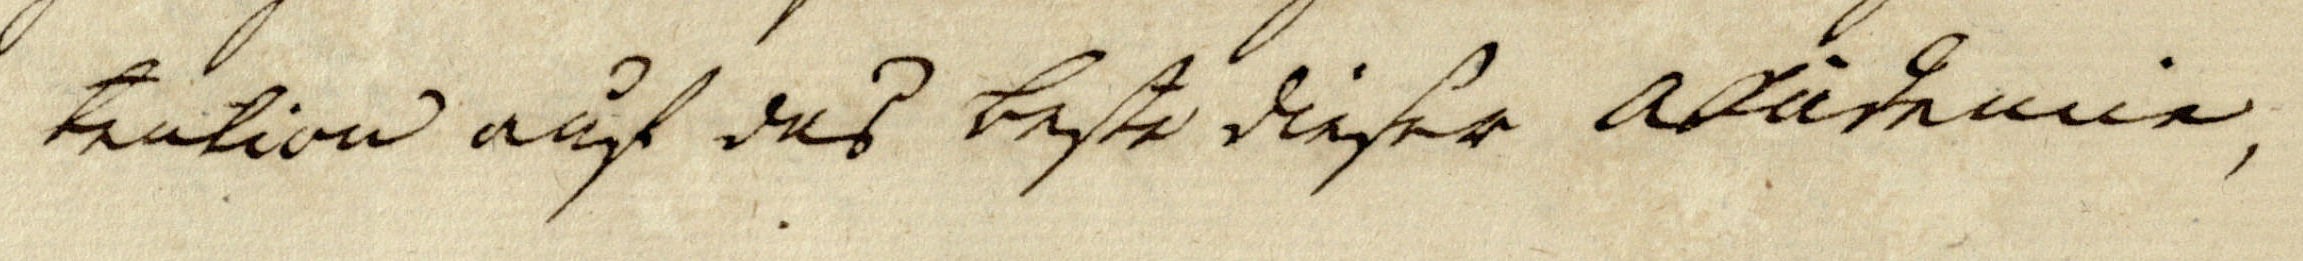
tention auf das Beste dieser Akademie,
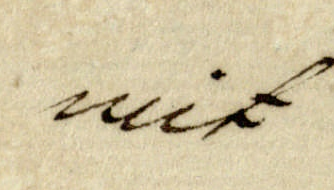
mit
